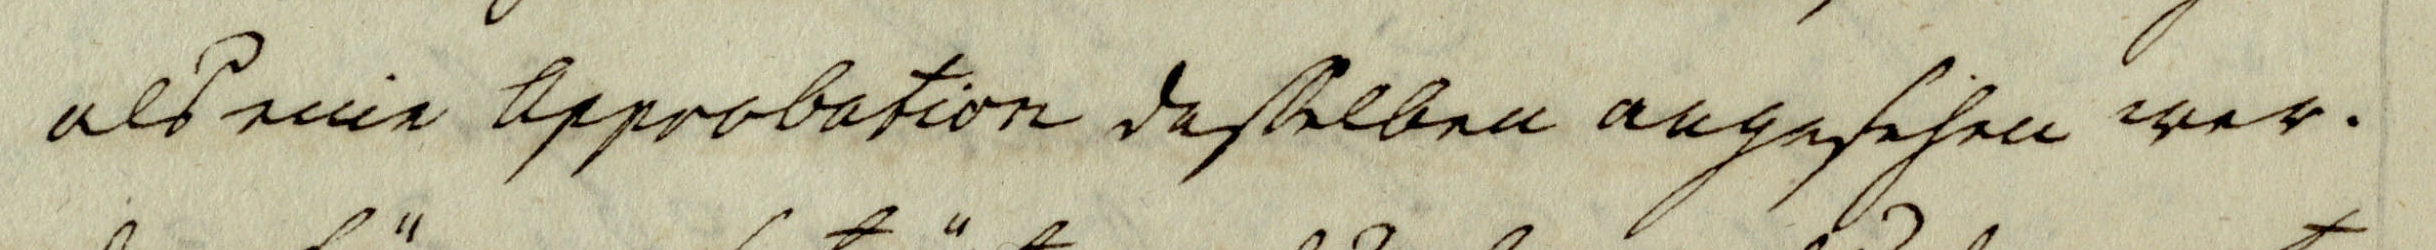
als eine Approbation desselben angesehen wer¬
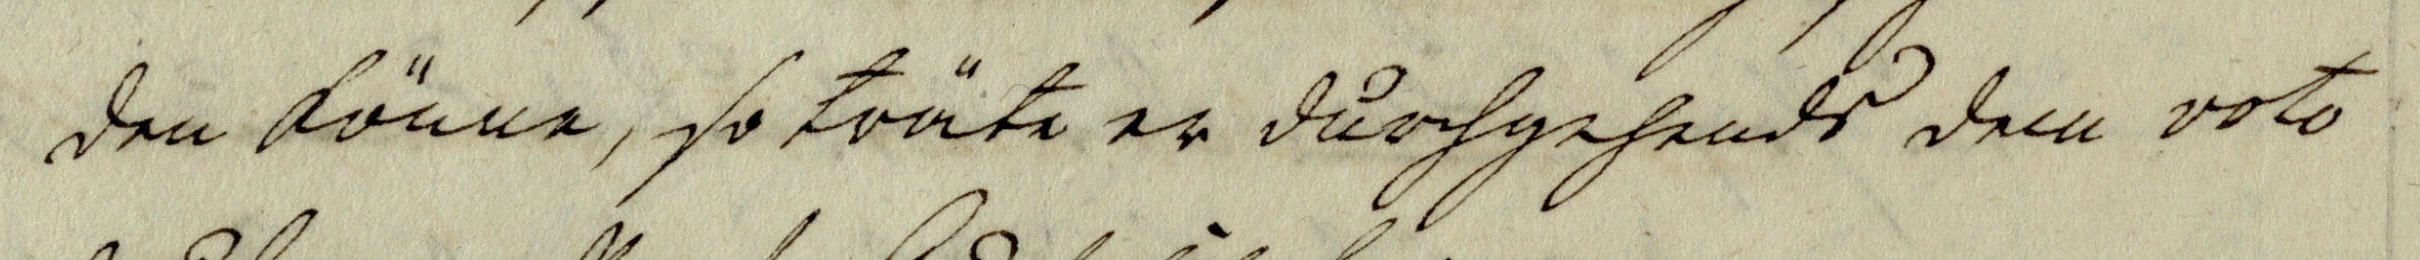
den könne, so träte er durchgehends dem voto
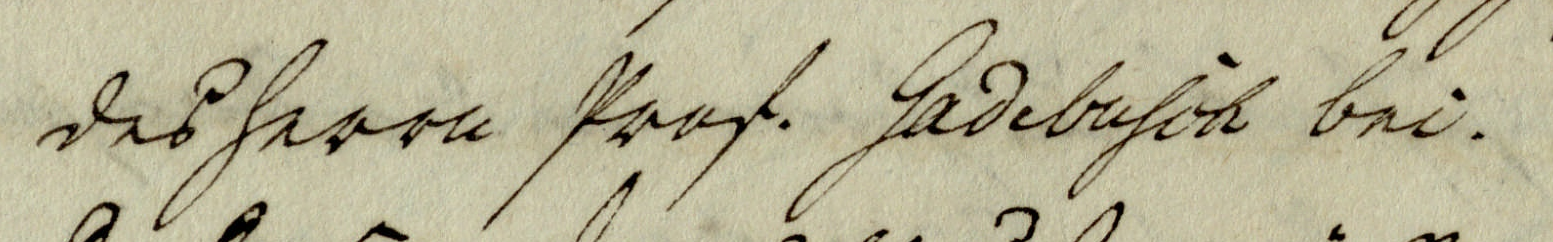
des Herrn Prof. Gadebusch bei.
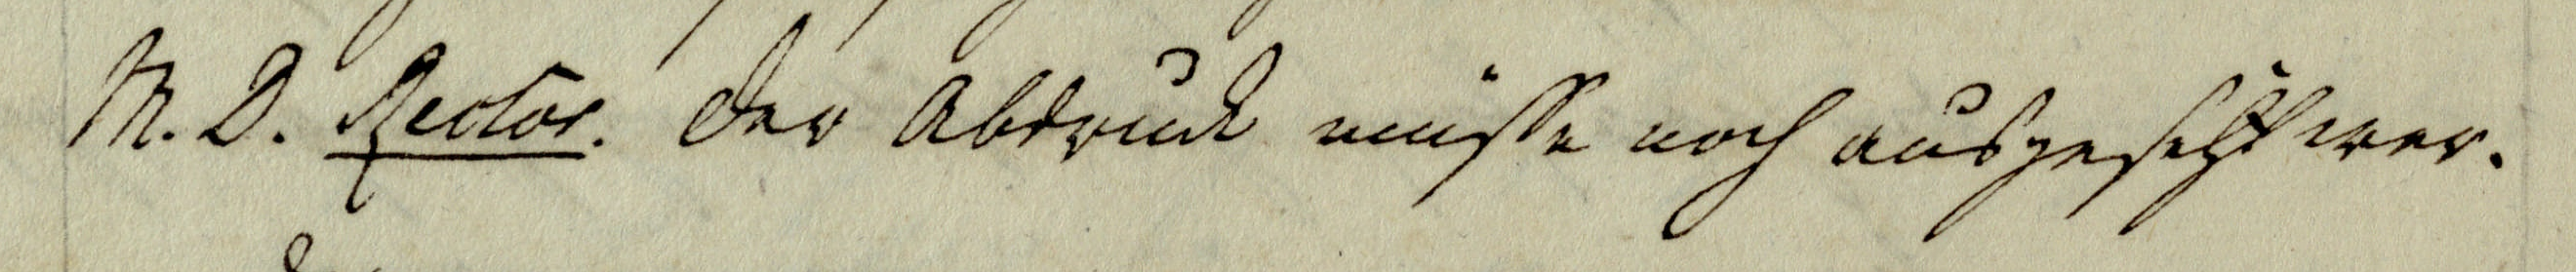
M. D. Rector. Der Abdruck müsse noch ausgesetzt wer¬
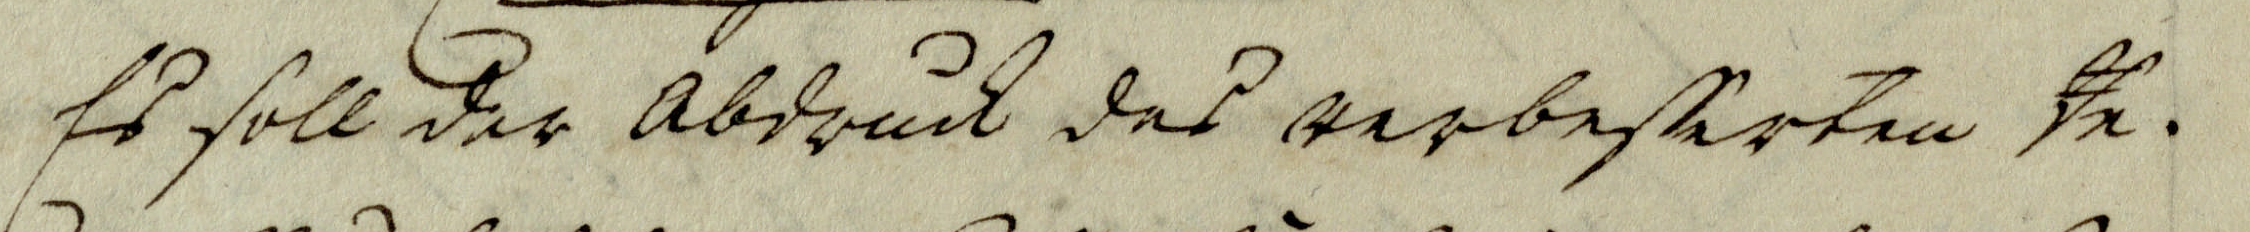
Es soll der Abdruck des verbesserten Re¬
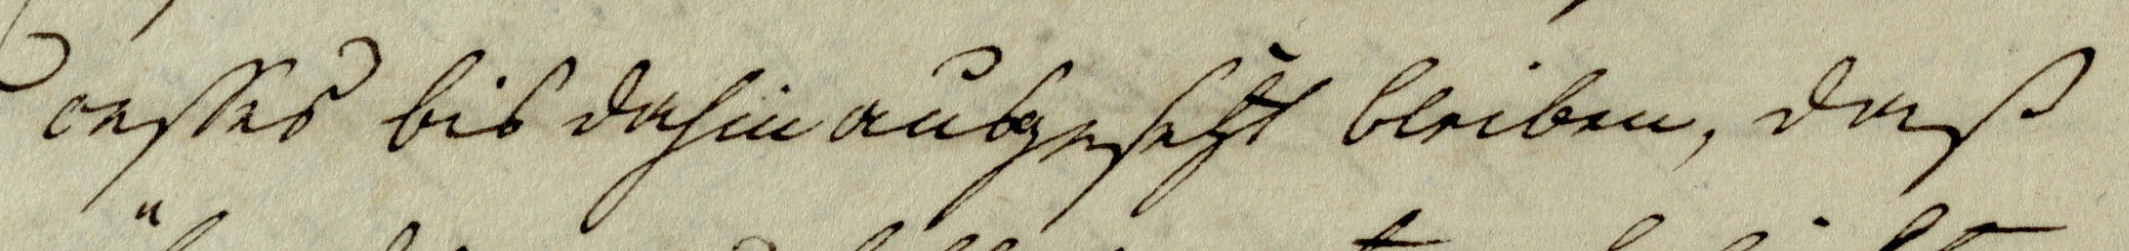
cesses bis dahin ausgesetzt bleiben, daß
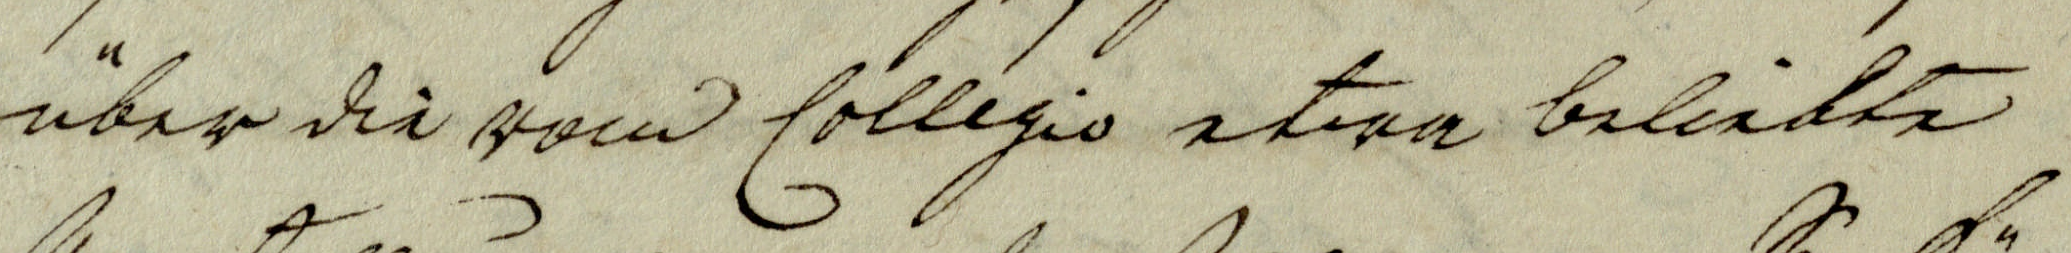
über die vom Collegio etwa beliebte
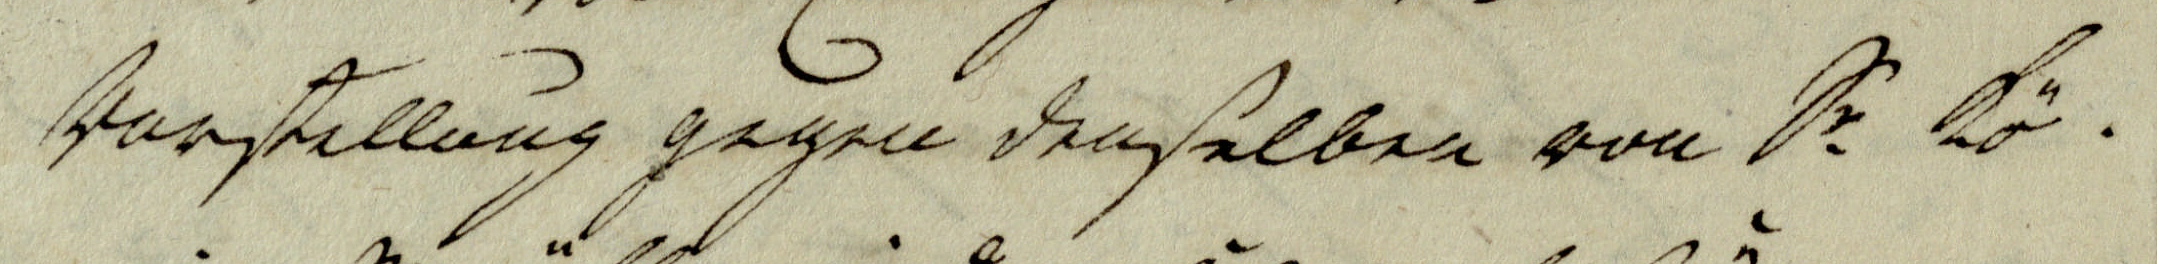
Vorstellung gegen denselben von Sr Kö¬
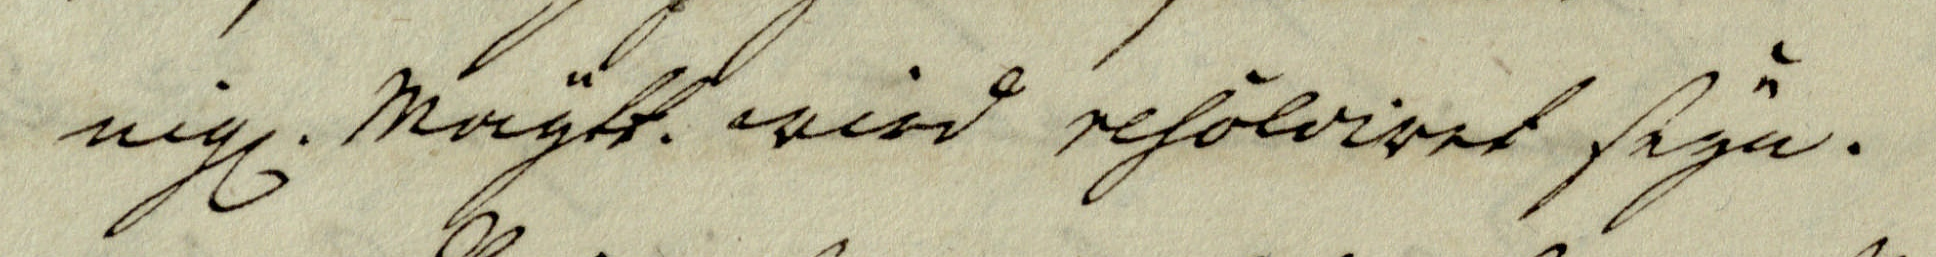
nigl. Maÿtt. wird resolviret seÿn.
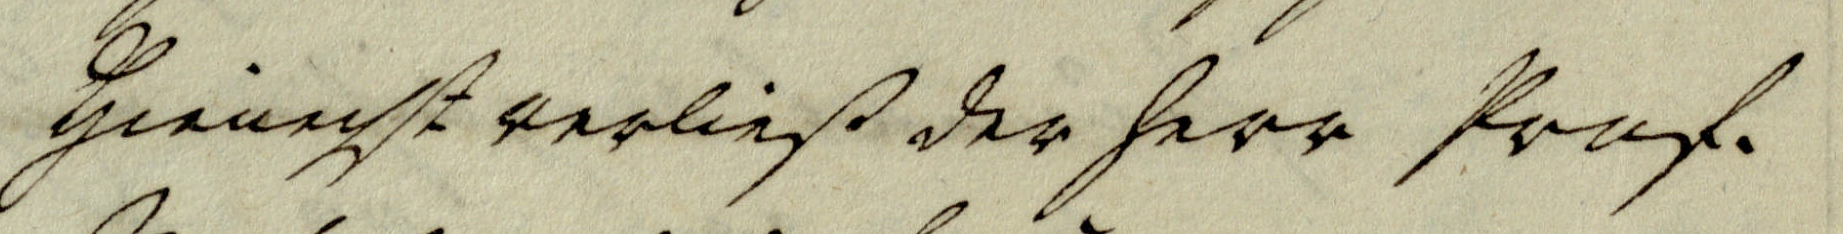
Hienechst verließ der Herr Prof.
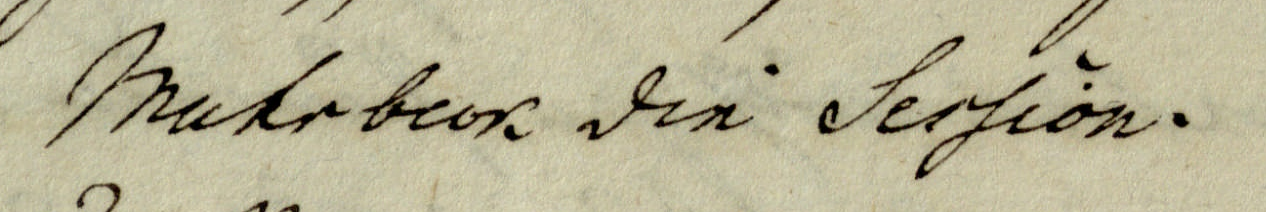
Muhrbeck die Session.
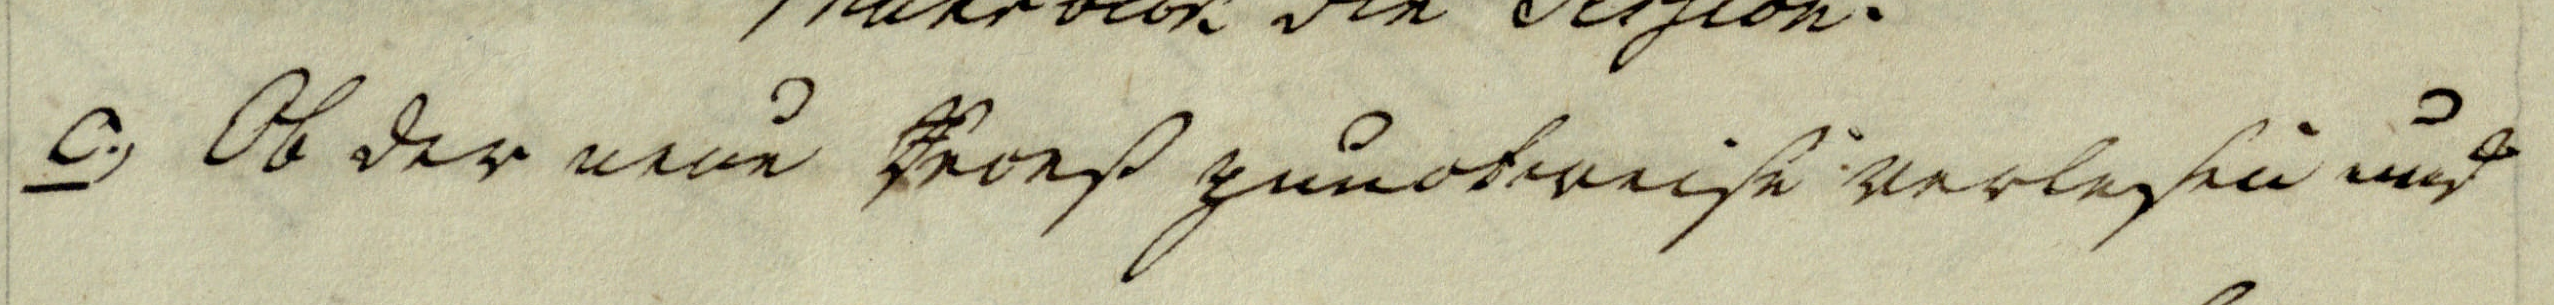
c., Ob der neue Receß punctweise verlesen und
